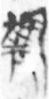執
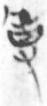事
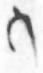内（人）
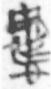○（書）
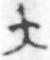入
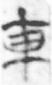車
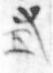○（右）
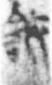○（令）
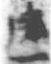建
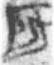所
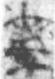𨍱（乘）
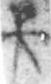大
